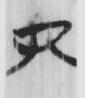四
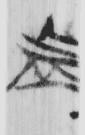者
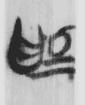爲
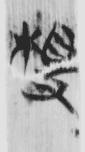{相又}
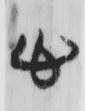心
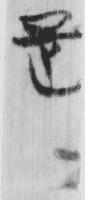是
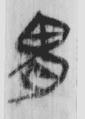胃
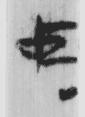𠁩
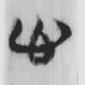心
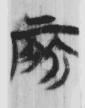所
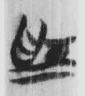爲
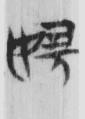{女𡵂}
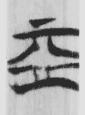亞
